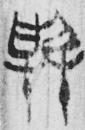與
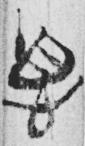惪（德）
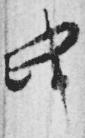女（如）
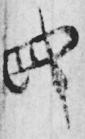母（毋）
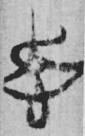○（愛）
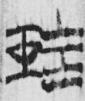珪
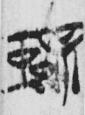璧
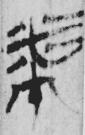○（幣）
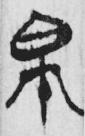帛
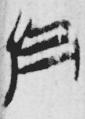於
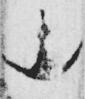山
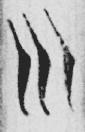川
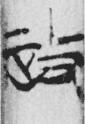政
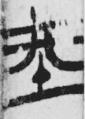○（刑）
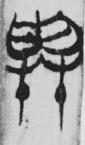與
